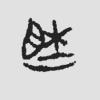相
